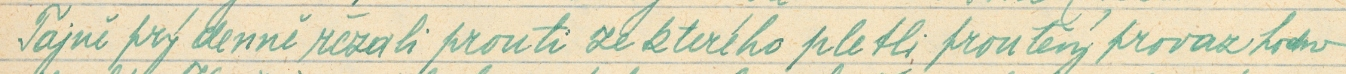Tajně prý denně řezali prouti ze kterého pletli proutěný provaz hodně
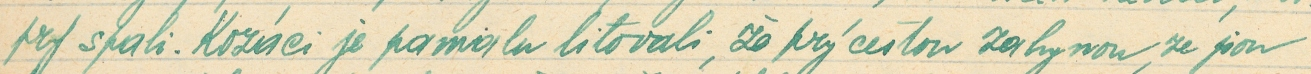prý spali. Kozáci je pomalu litovali, že prý cestou zahynou, ze jsou
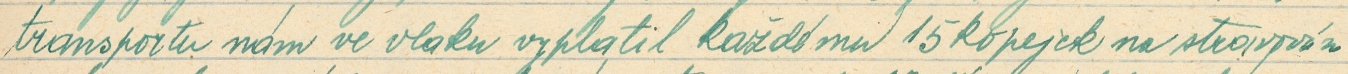transportu nám ve vlaku vyplatil každému 15 kopejek na stravováni
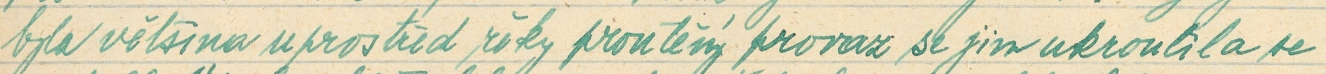byla většina uprostřed řeky proutěný provaz se jim ukroutil a se
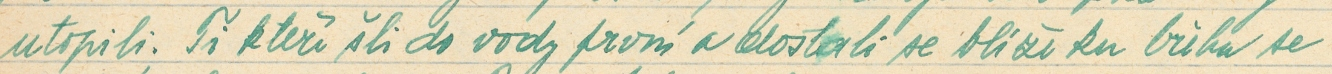utopili. Ti kteří šli do vody první a dostali se blíže ku břehu se
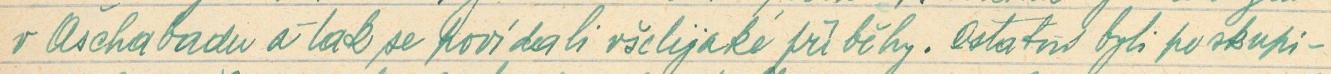v Ašchabadu a tak se povídali všelijaké příběhy. Ostatní byli po skupi-
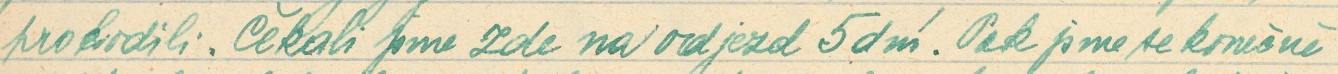probodili. Čekali jsme zde na odjezd 5 dní. Pak jsme se konečně
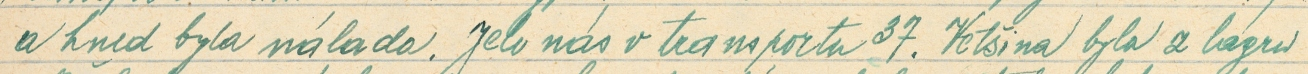a hned byla nálada. Jelo nás v transportu 37. Většina byla z lágru
